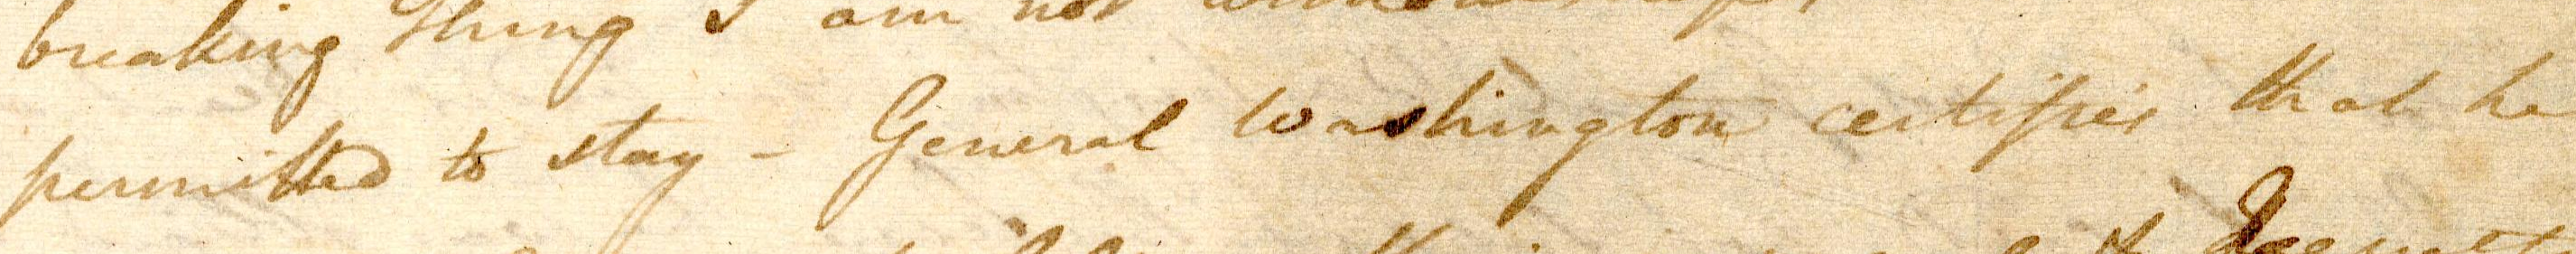permitted to stay. General Washington certifies that he
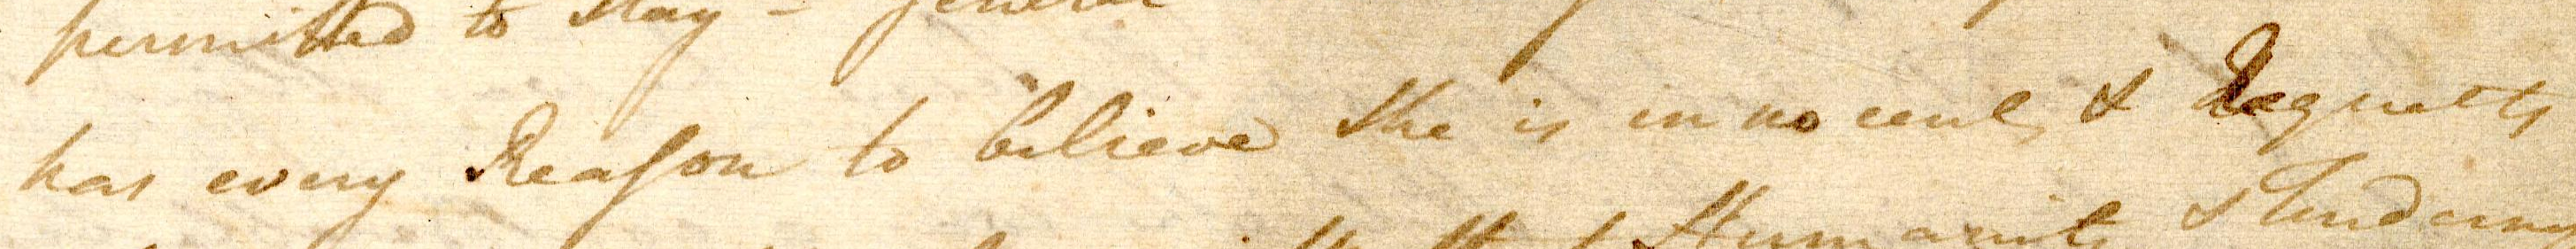has every Reason to believe she is innocent & Requests
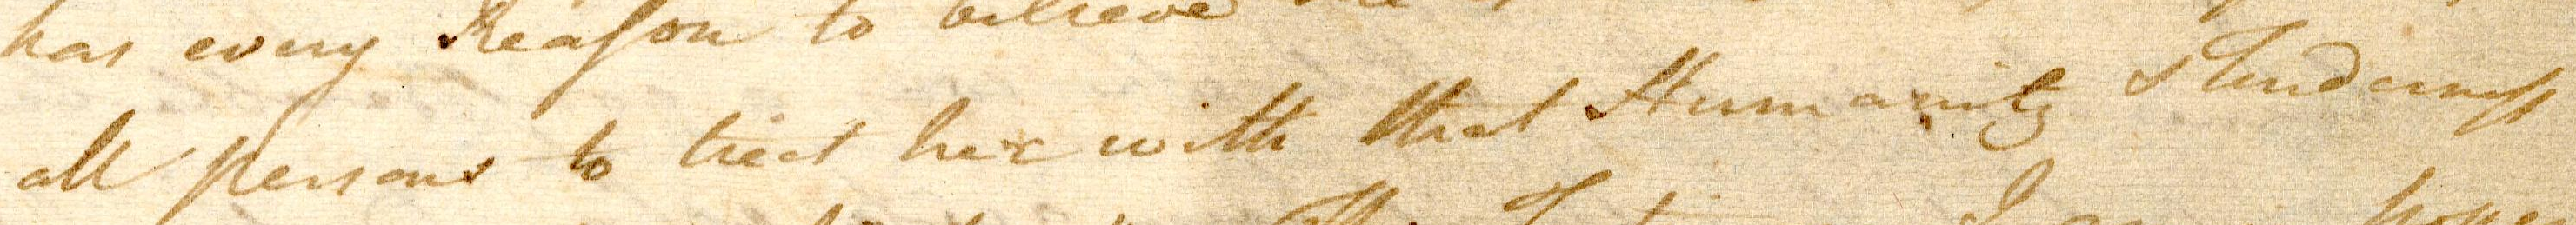all persons to treat her with that Humanity & Tenderness
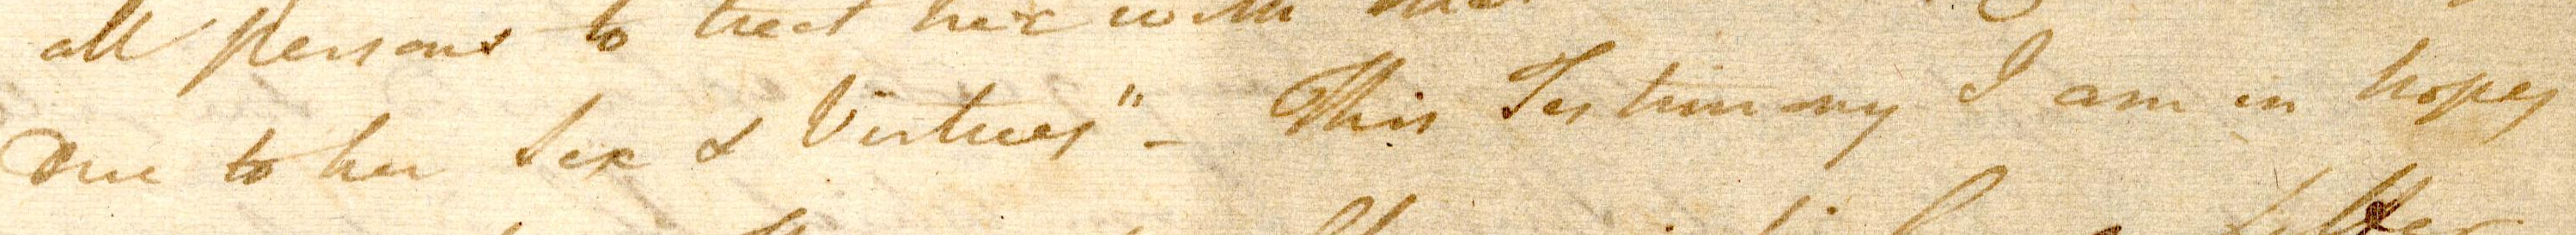due to her Sex & Virtues."- This Testimony I am in hope
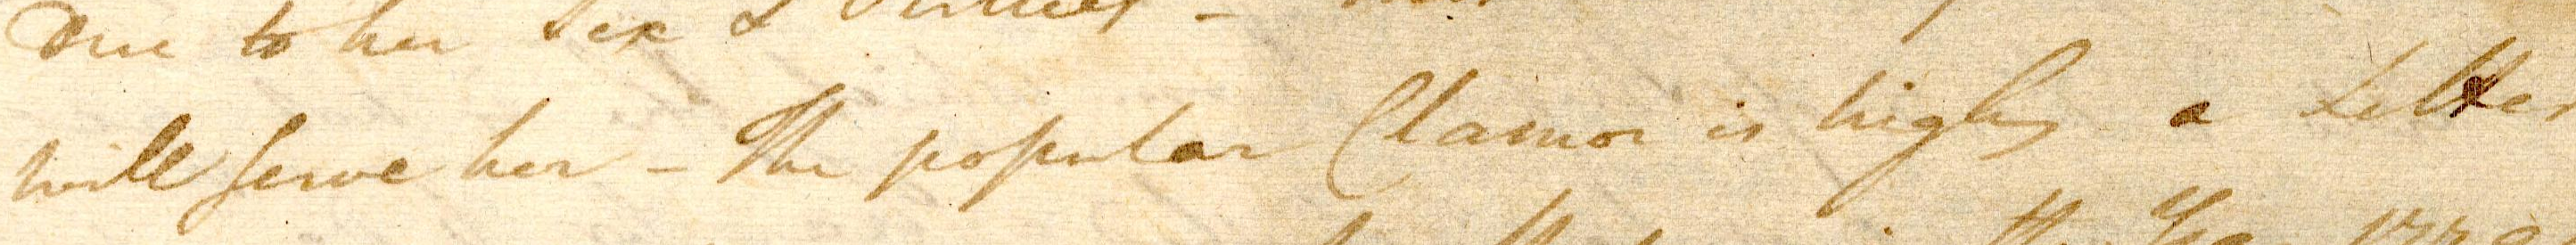will serve her. The popular Clamor is high a Letter
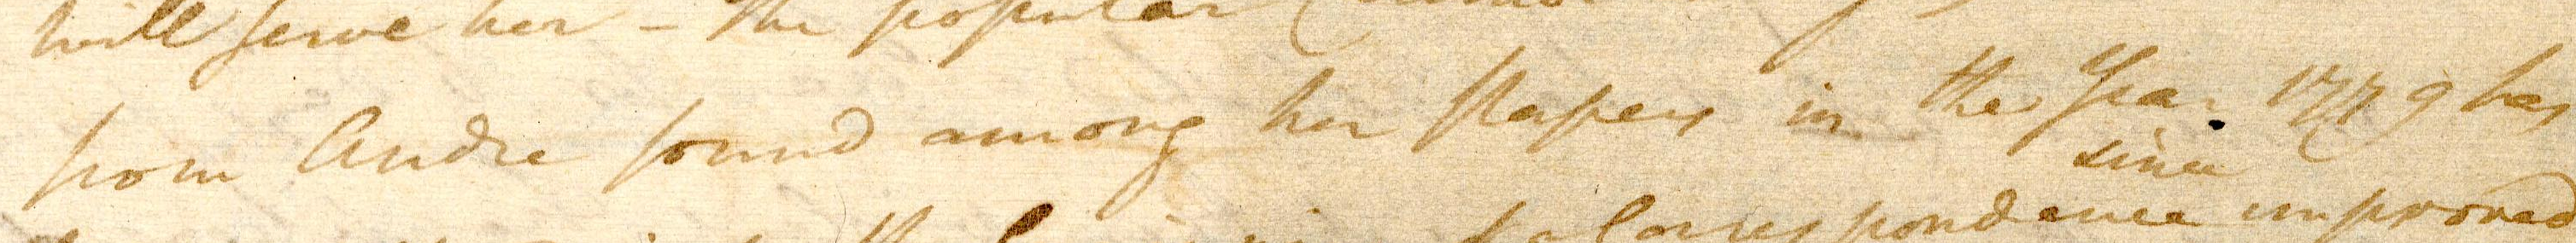from Andre found among her Papers in the Year 1779 has
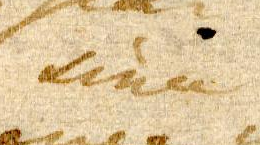since
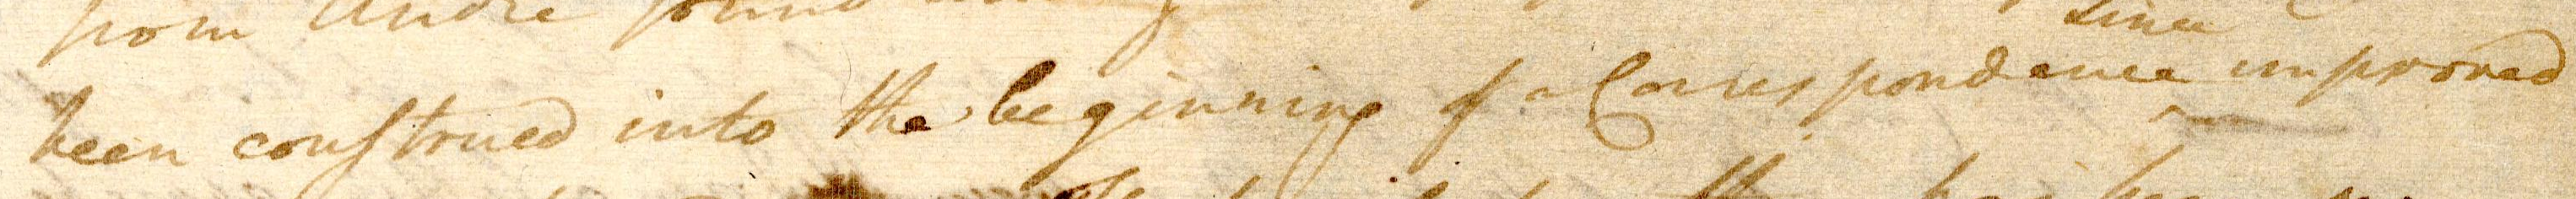been construed into the beginning of a Correspondence improved
